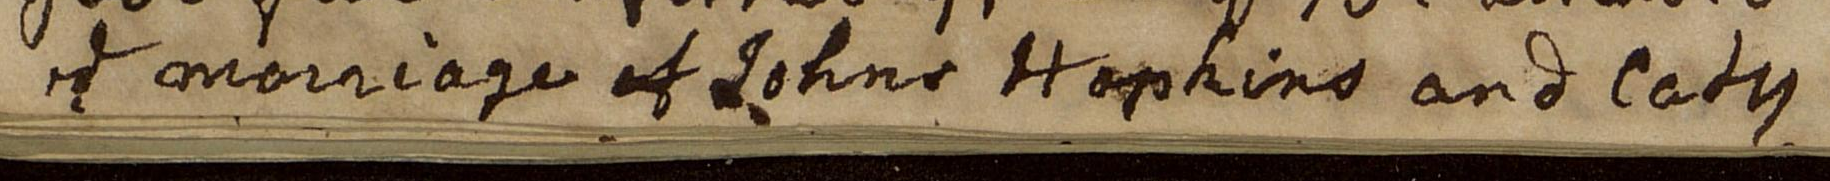y^e marriage of Johns Hopkins and Caty
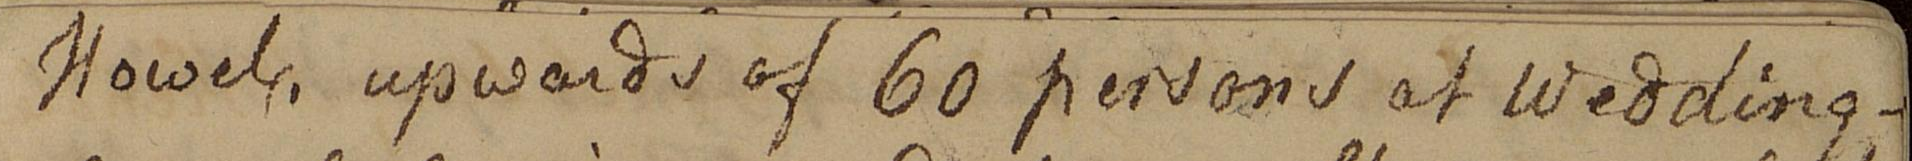Howel, upwards of 60 persons at Wedding-
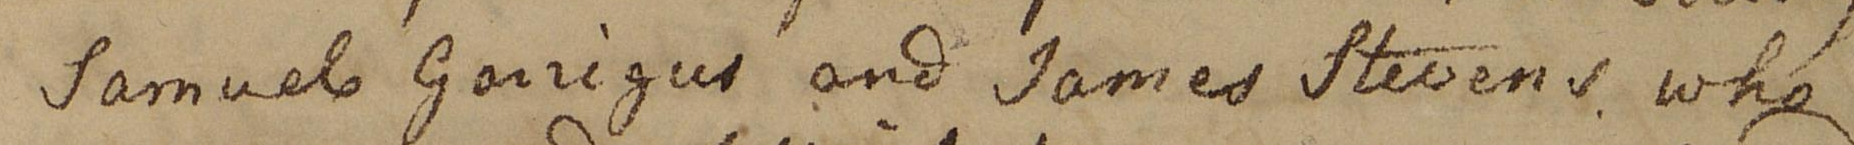Samuel Ganigus and James Stevens who
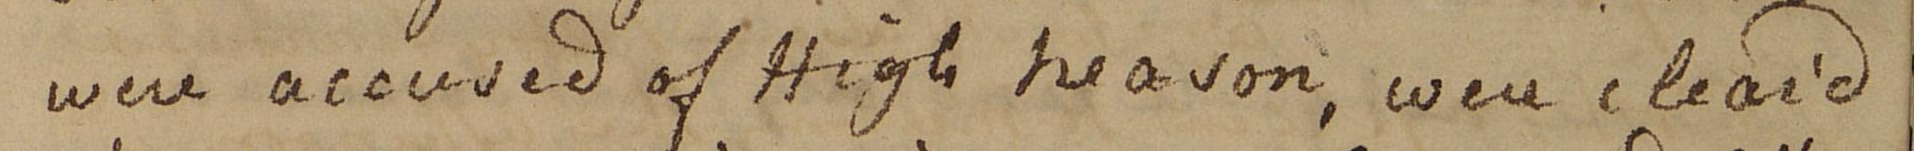were accused of High treason, were clear'd
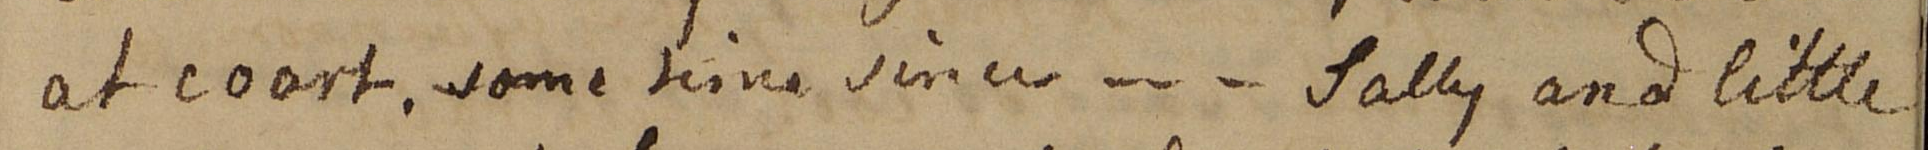at coart, some time since--- Sally and little
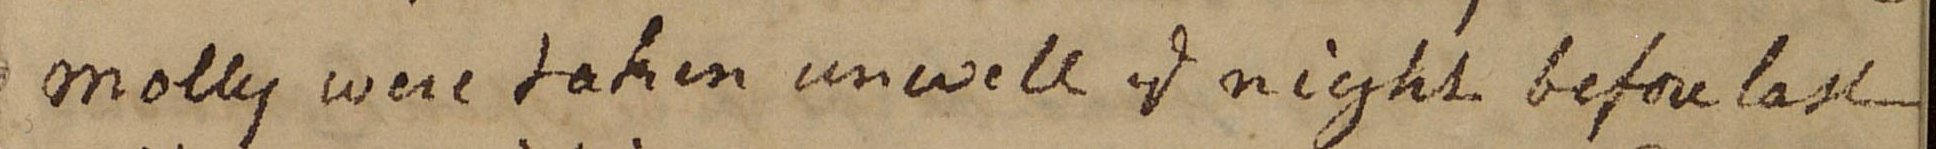Molly were taken unwell y^e night before last
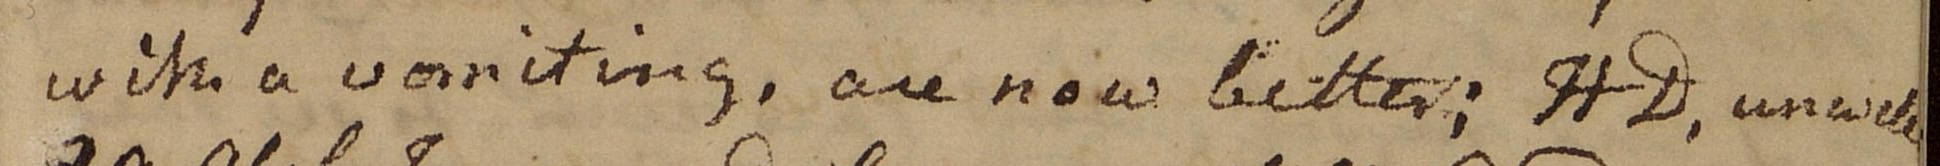with a vomiting, are now better; HD, unwell
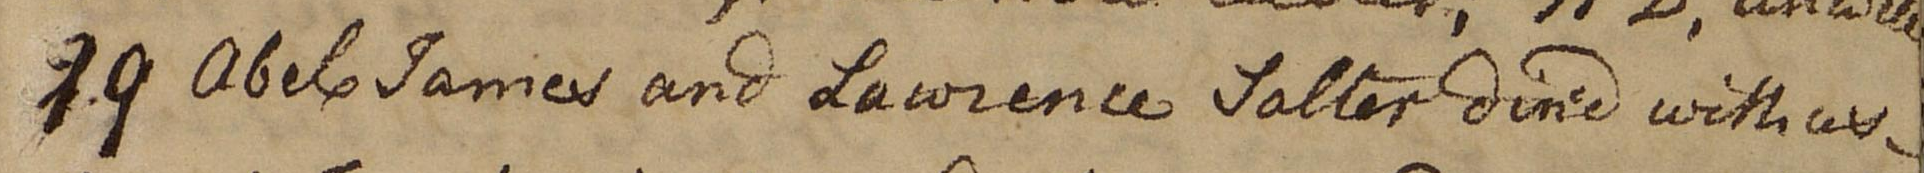19 Abel James and Lawrence Salter din'd with us-
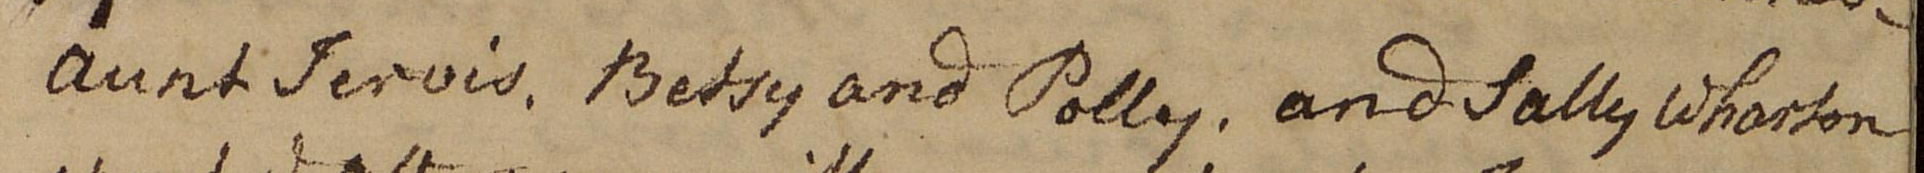Aunt Jervis, Betsy and Polly, and Sally Wharton
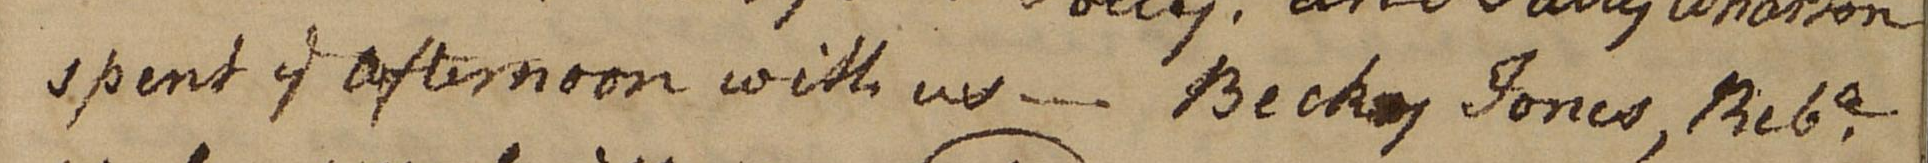spent y^e afternoon with us- Becky Jones, Reb^a.
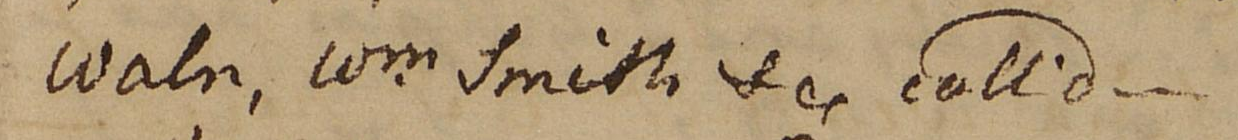Waln, W^m. Smith &c call'd-
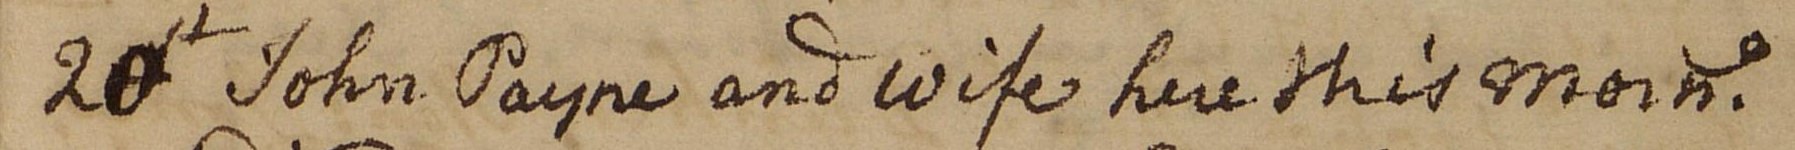20^t John Payne and Wife here this morn^g.
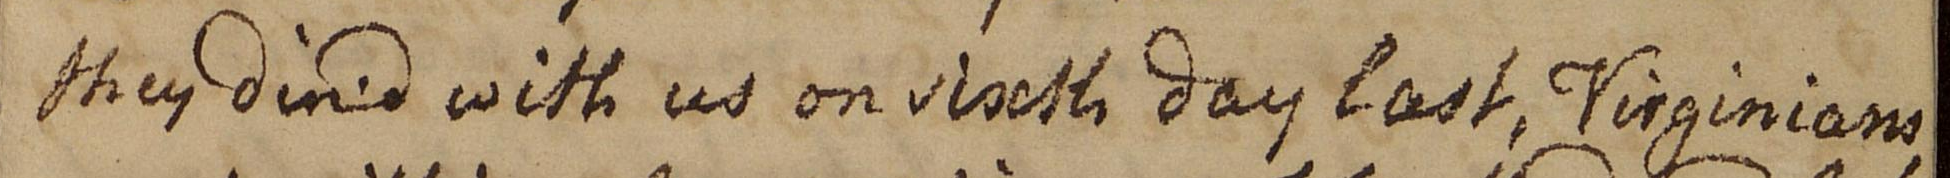they din'd with us on sixth day last, Virginians,
